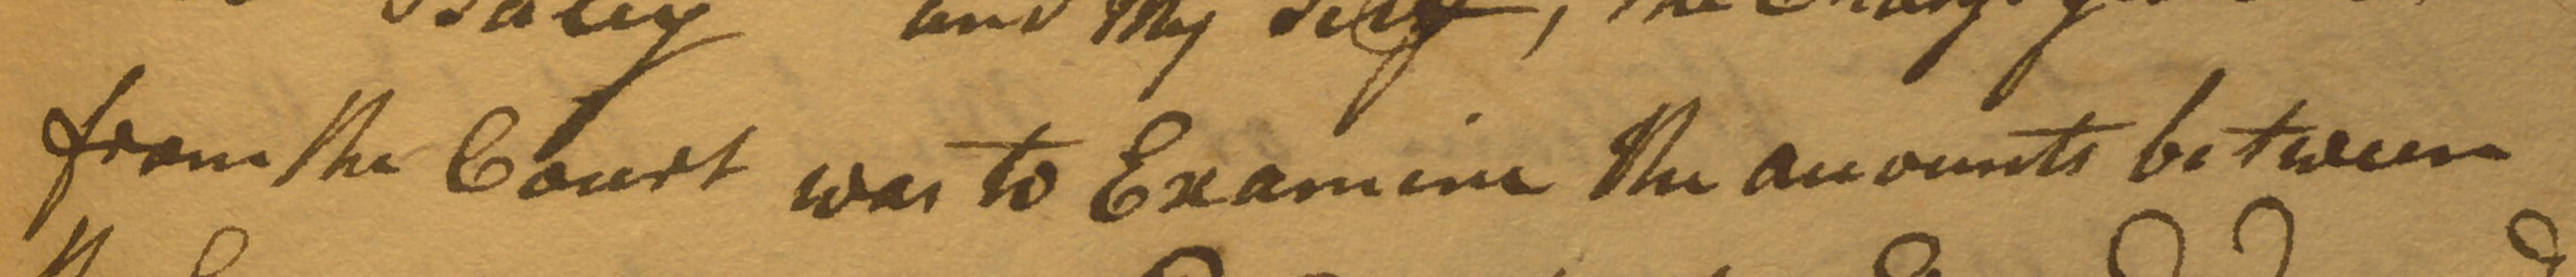from the Court was to Examine the accounts between
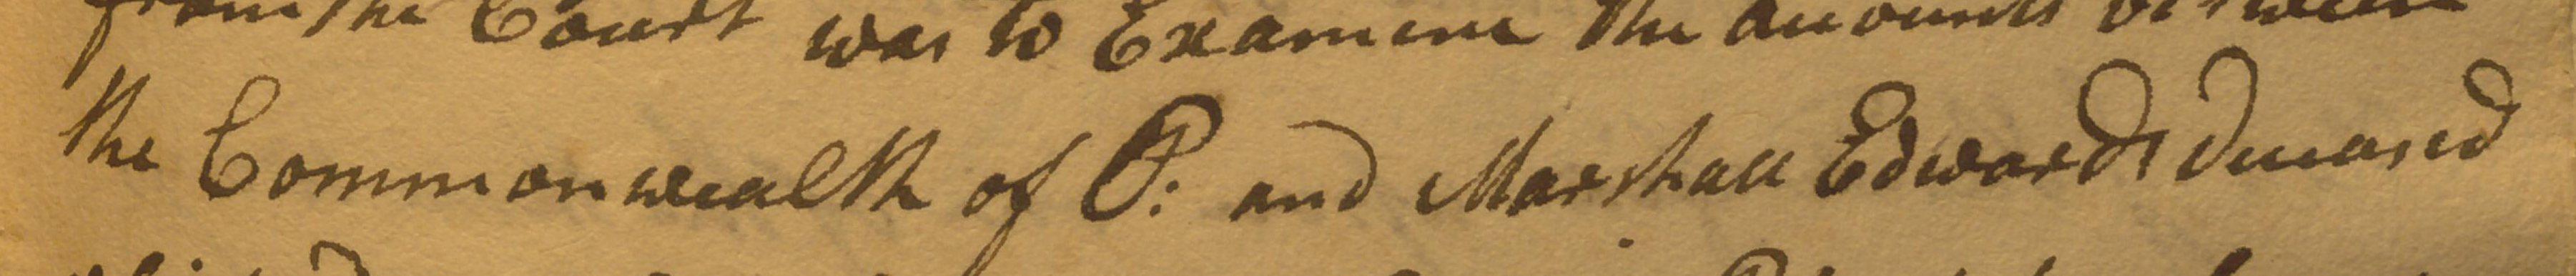the Commonwealth of P: and Marshall Edwards deceased
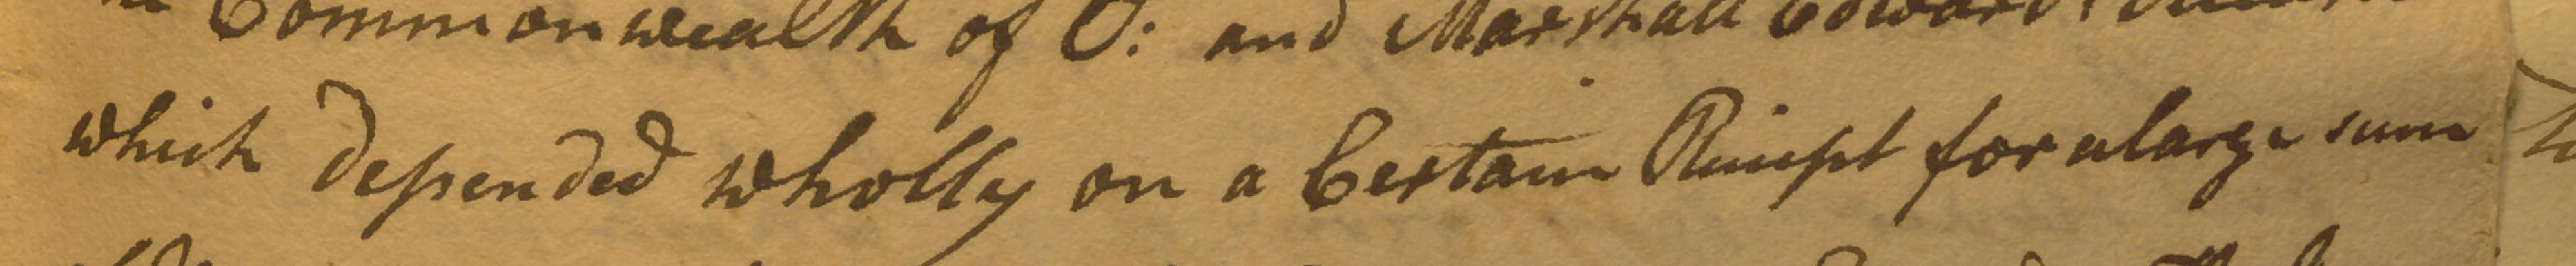which depended wholly on a Certain Receipt for a large sum
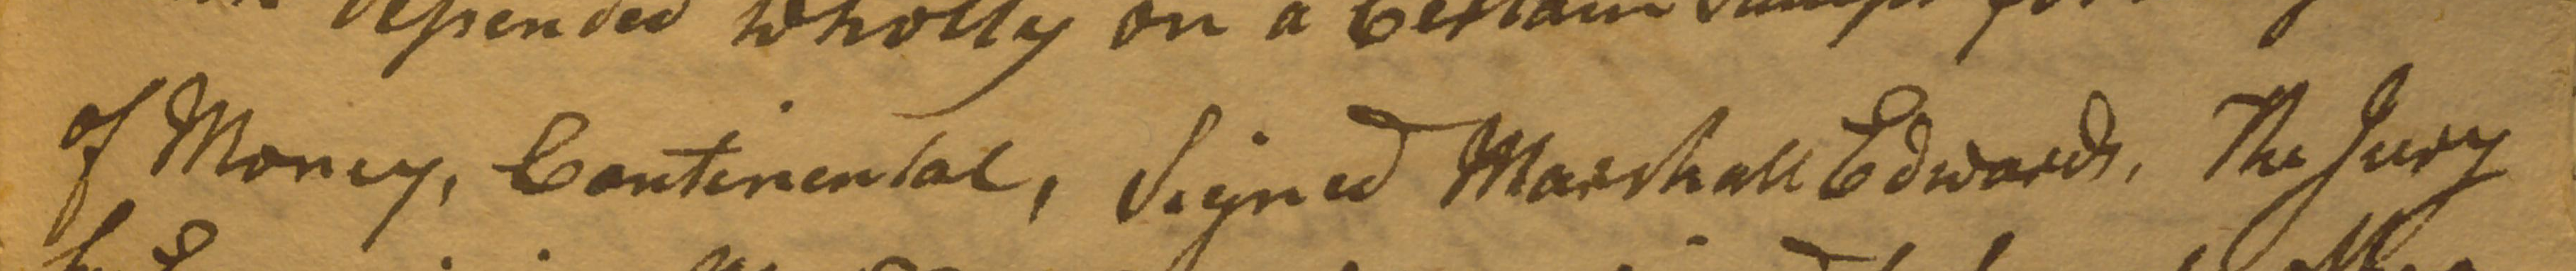of Money, Continental, signed Marshall Edwards. The Jury
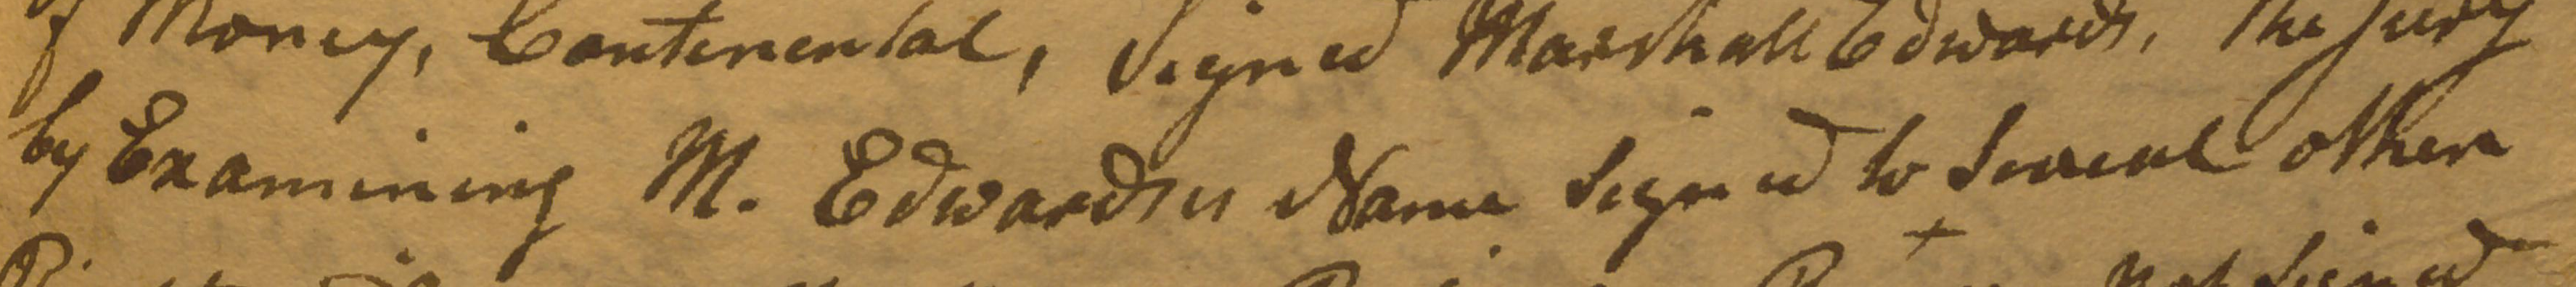by Examining M. Edwardses Name signed to Several other
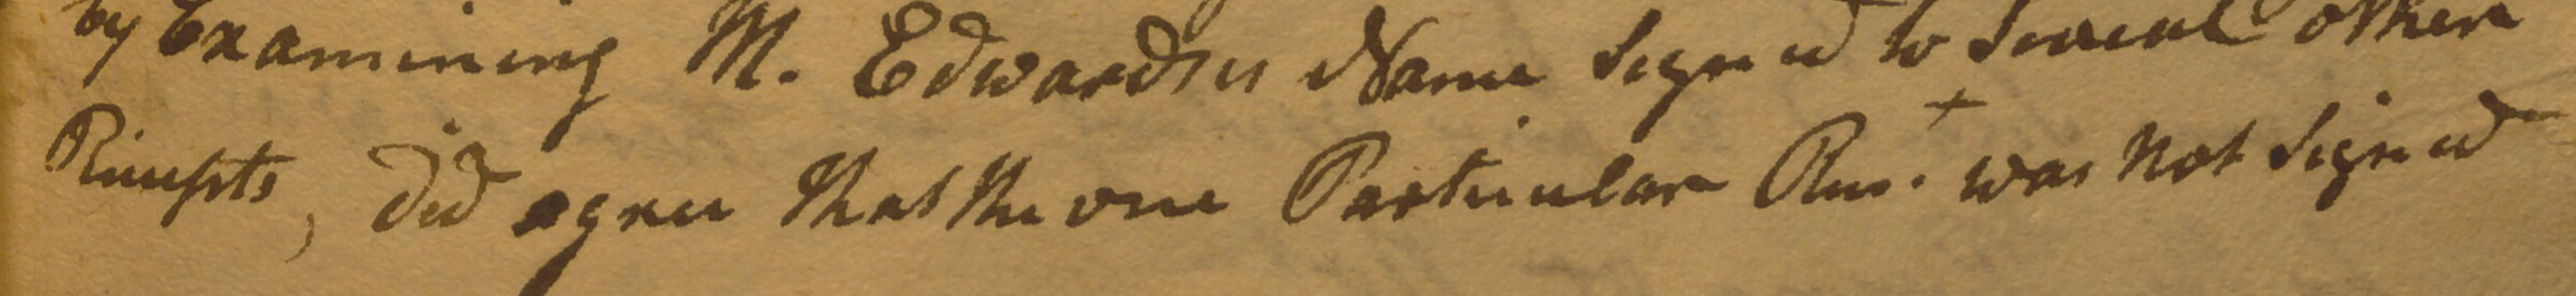Receipts, did agree that the one Particular Rec^t. was not signed
